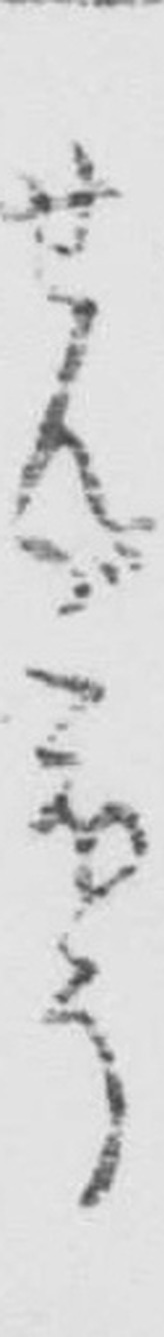せんごほう
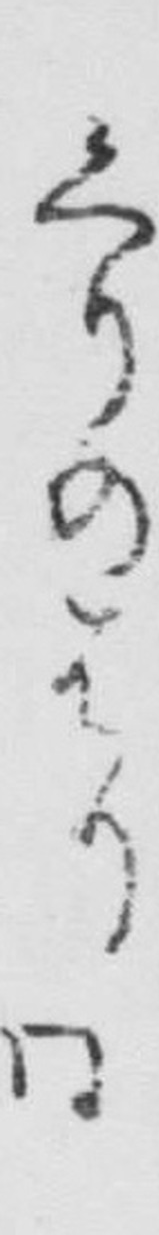くりのはり同
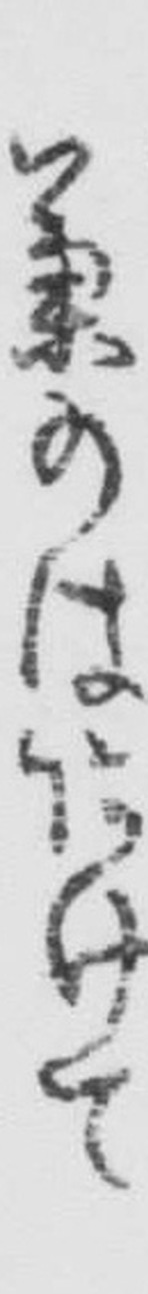菊のはあけて
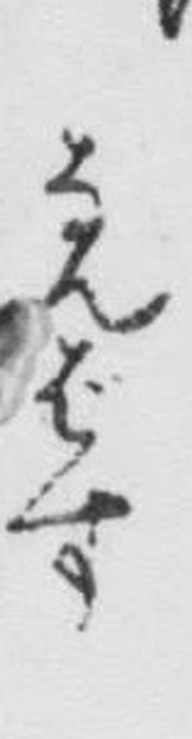なんばす
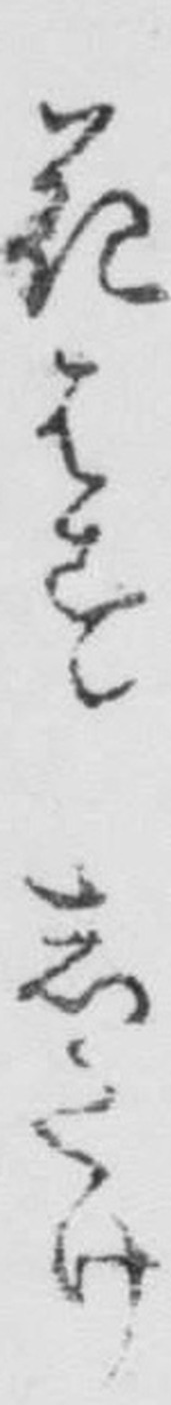花はすしたけ
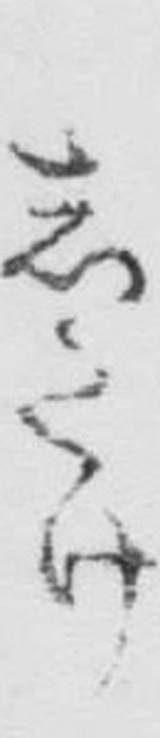岩たけ
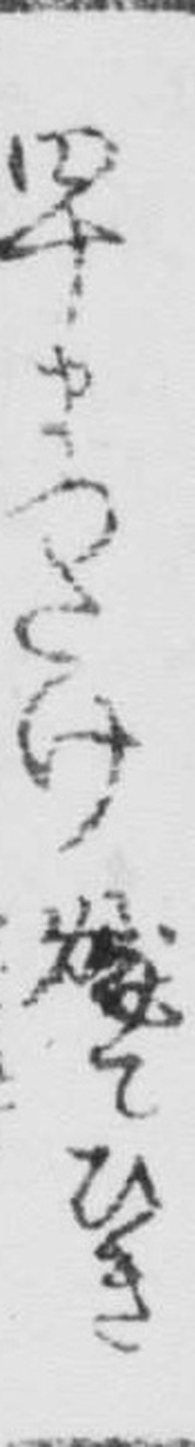早まつたけ焼てひき
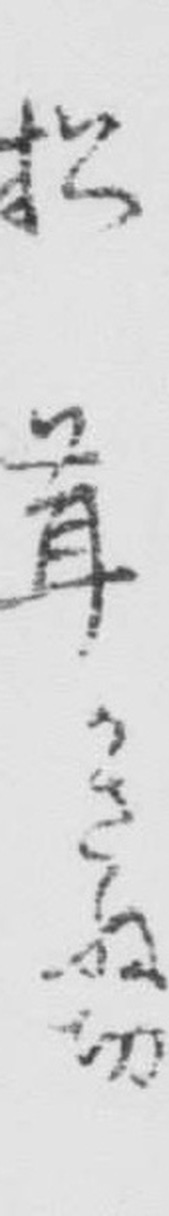松茸かさね切
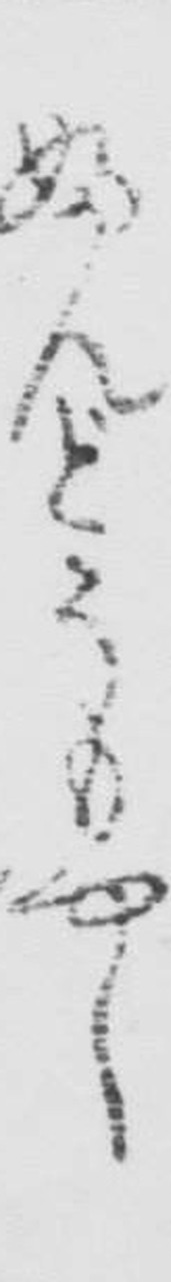ふんどうもやし
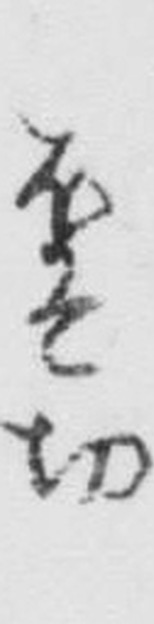ほそ切
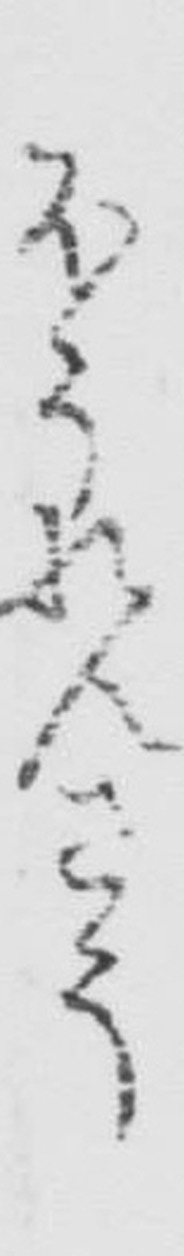ほうれんさう
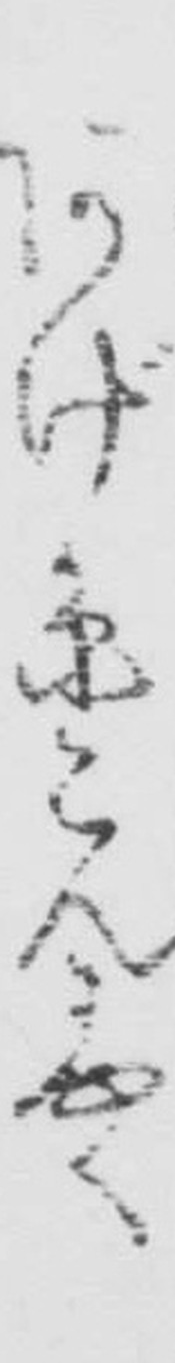あげ糸こんにやく
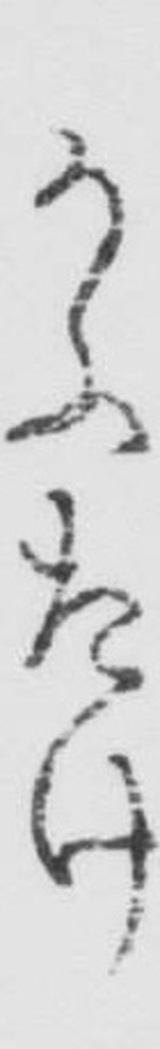かふたけ
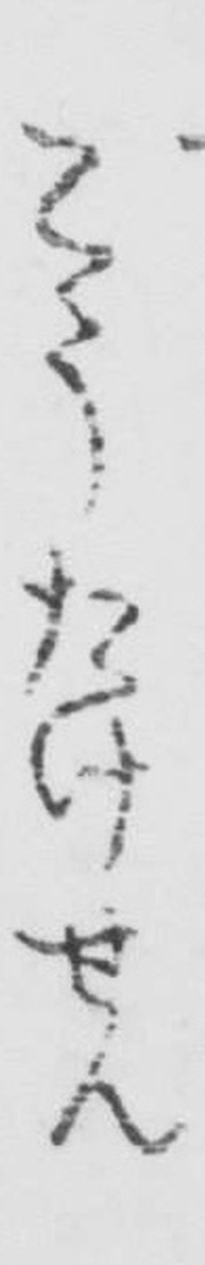こうたけせん
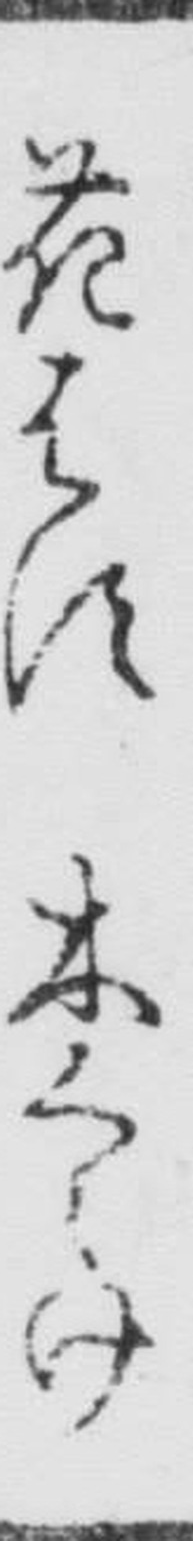花はす木くらけ
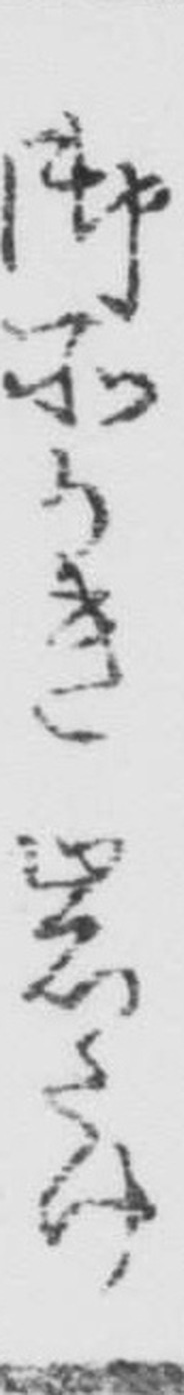御所かき岩たけ
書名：諸家通用/即席料理
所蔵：大阪府立大学学術情報センター 国文学研究資料館
